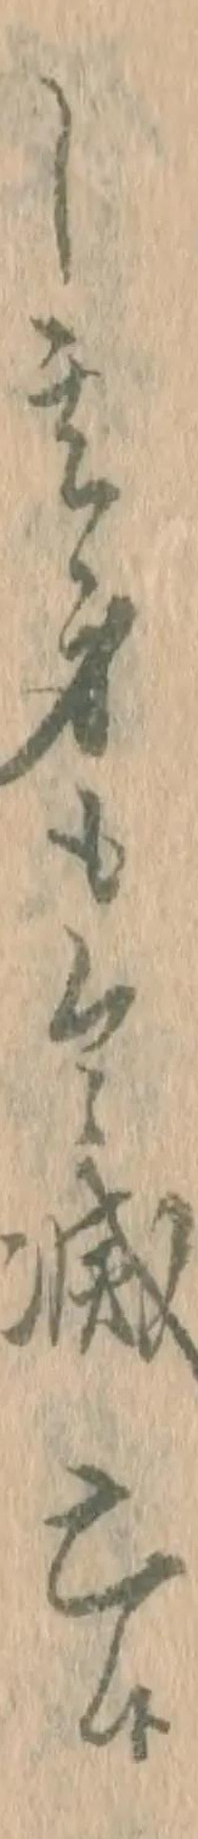し其身も令滅亡候
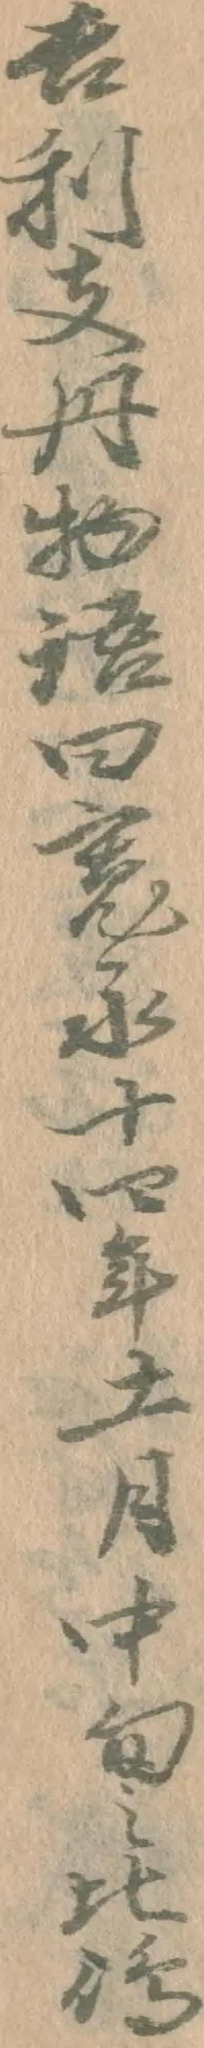吉利支丹物語曰寛永十四年十一月中旬之比島
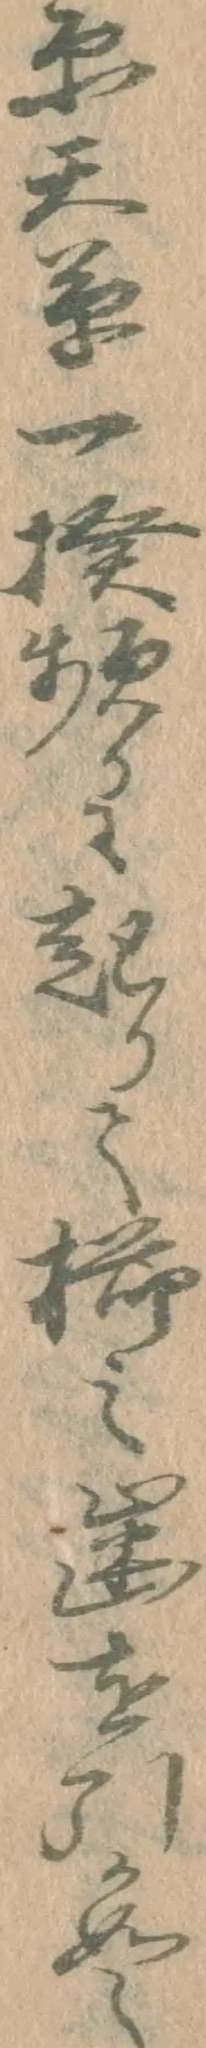原天草一揆頻りに起りて櫛之歯を引か如し
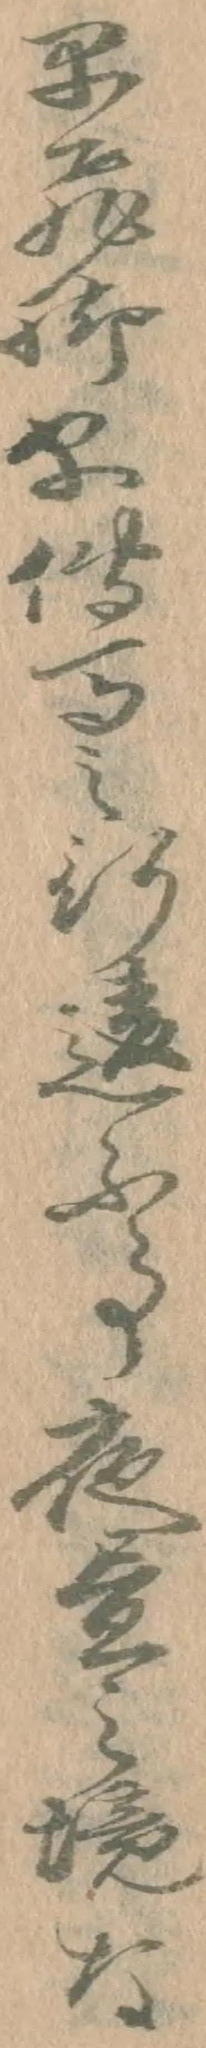早飛脚早伝馬之行違ふ事夜昼之境な
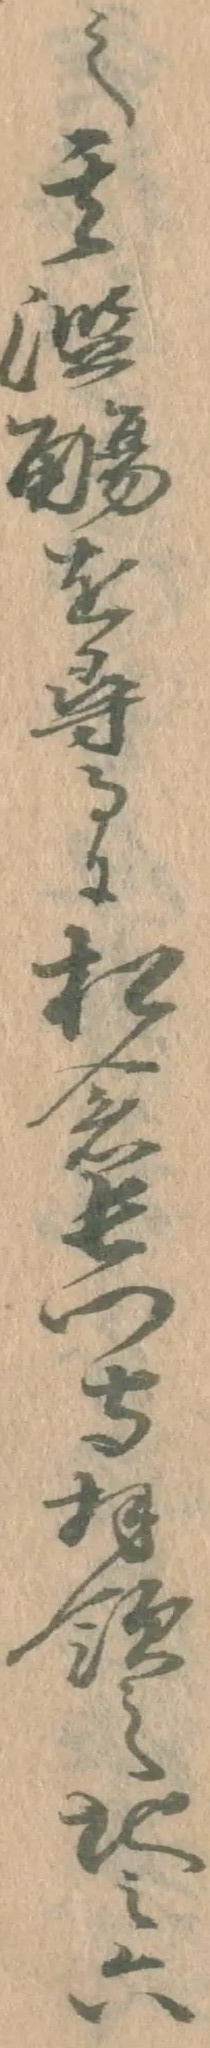し其濫觴を尋るに松倉長門守拝領之地之六
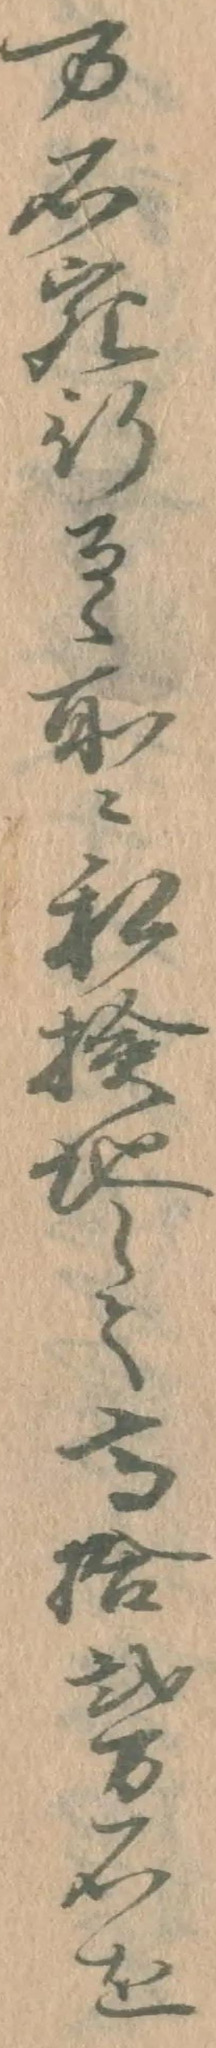万石宛行るゝ所に私検地して高拾弐万石を
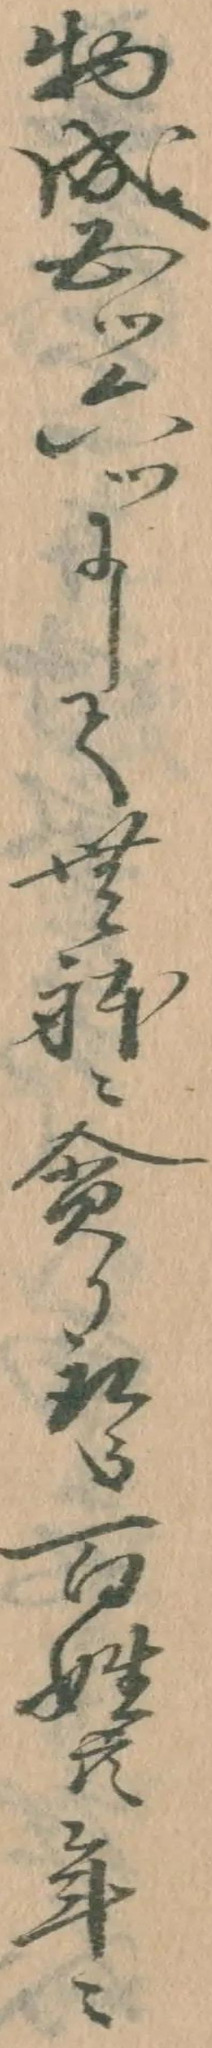物成五ッ六ッにして無体に貪り取る百姓共年々
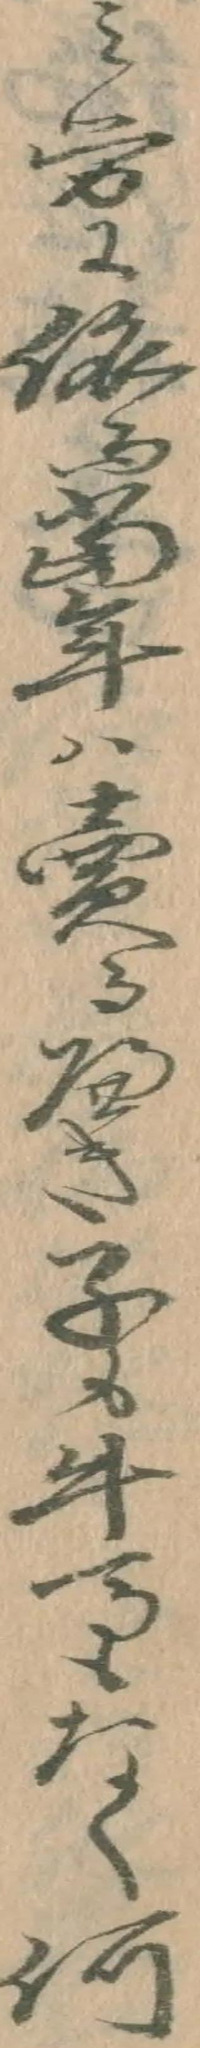之労に依而当年は売るへき子も牛馬もなく何
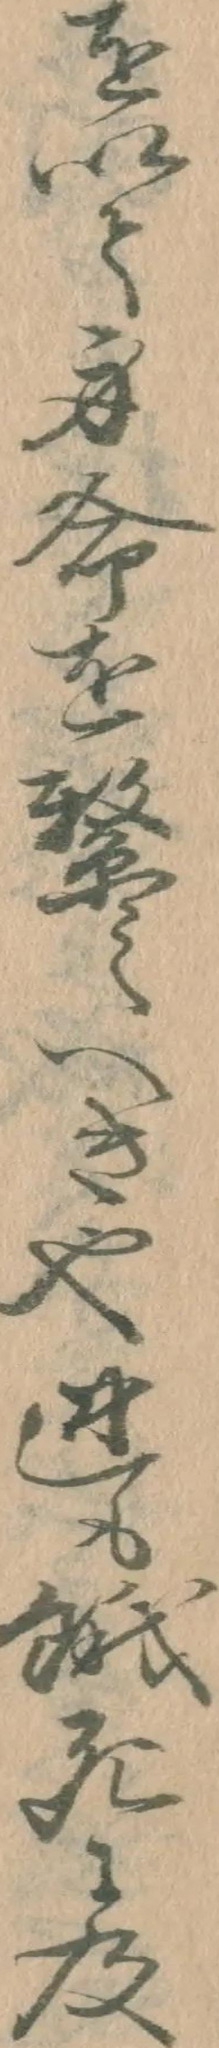を以て身命を繋くへきや迚も餓死に及
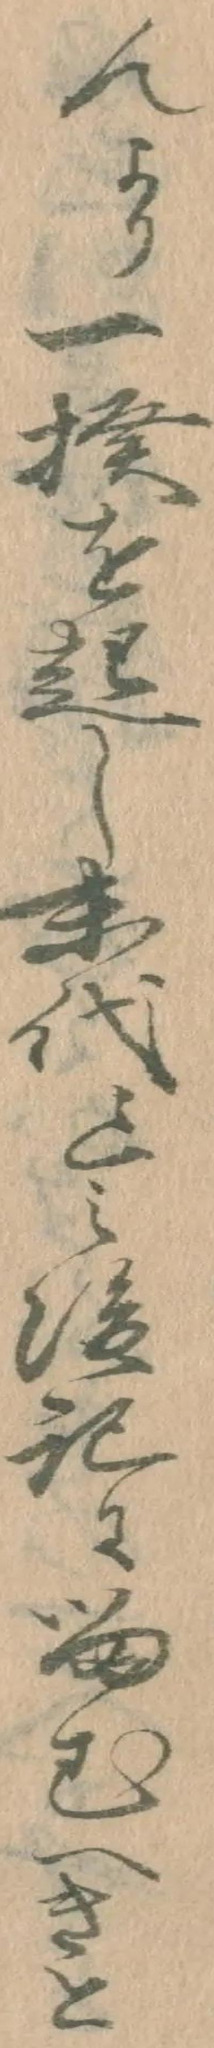んより一揆を起し末代迄之後記に留むへきと
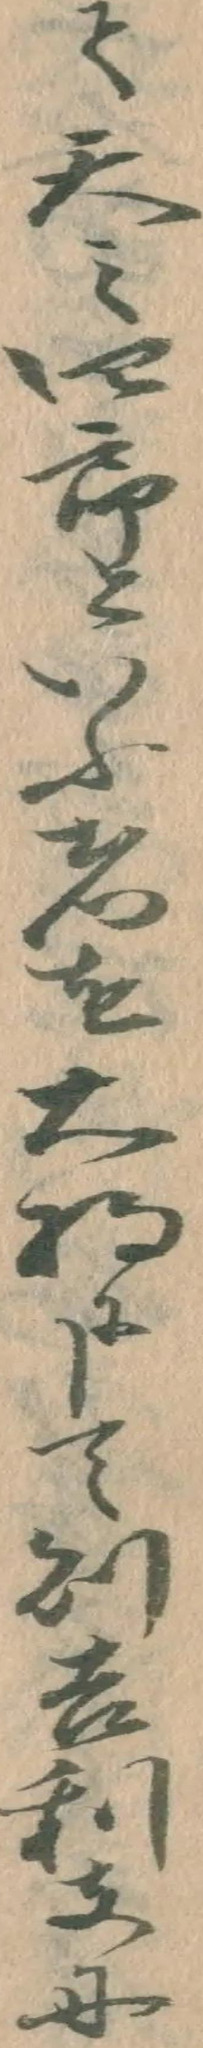て天之四郎といふ者を大将にして則吉利支丹
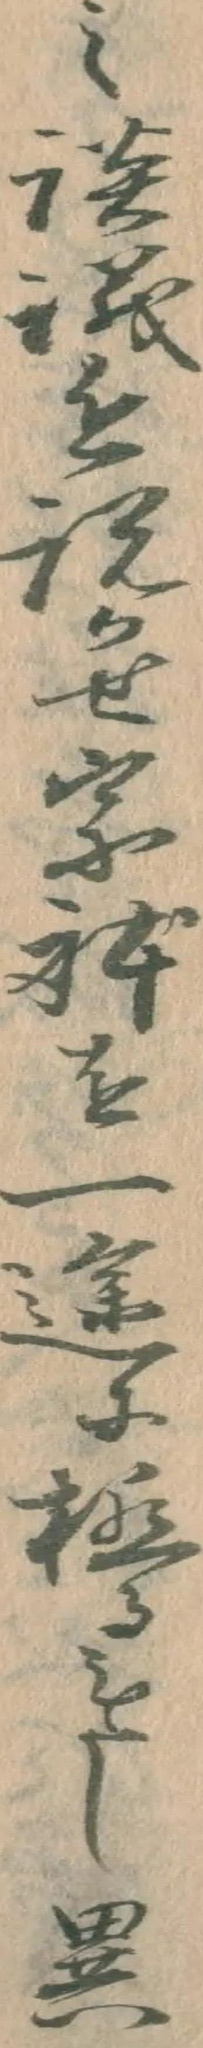之談議を説かせ宗体を一途に極るもし異
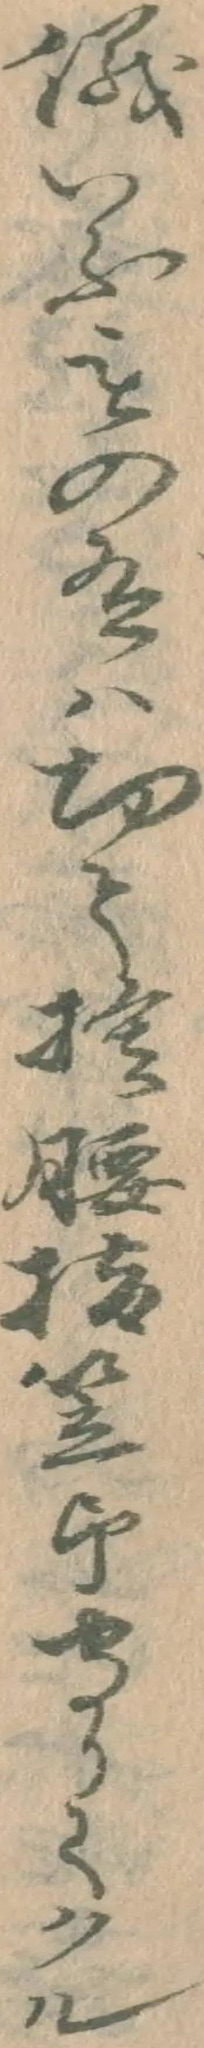儀いふもの有は切て捨腰指笠印守りてクル
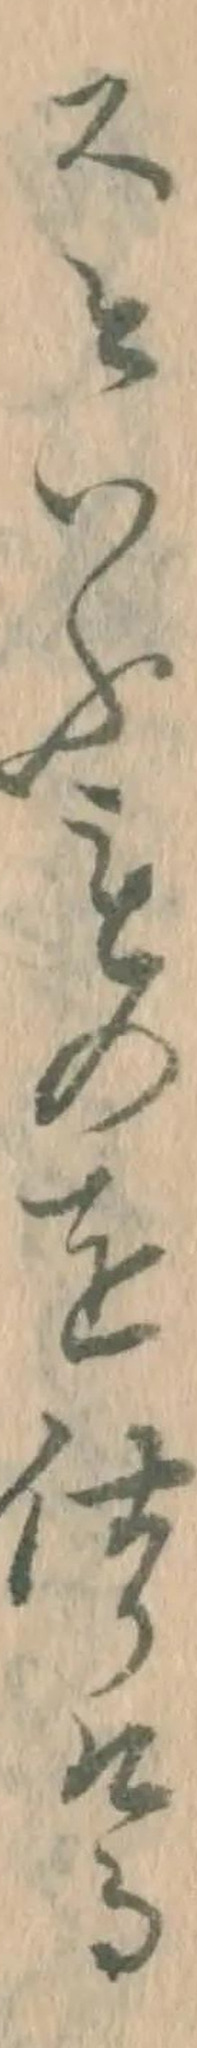スといふものを仕りける
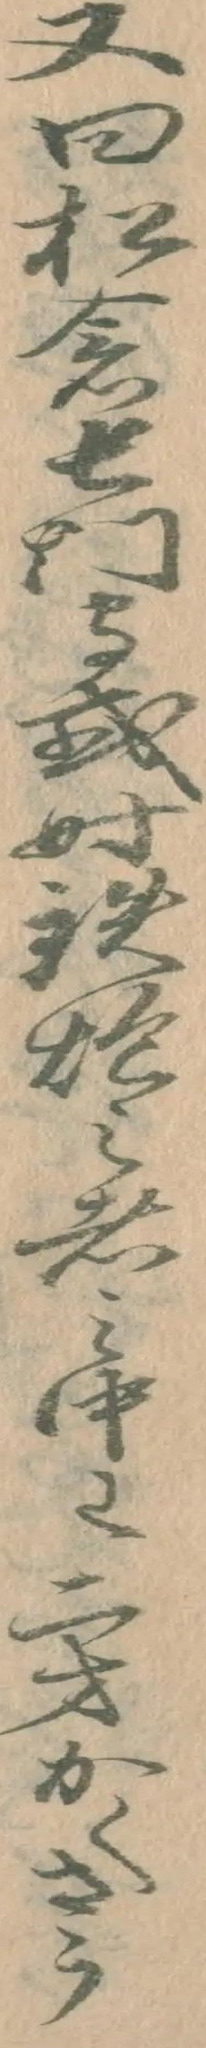又曰松倉長門守或時鉄炮之者之中に二才かくさう
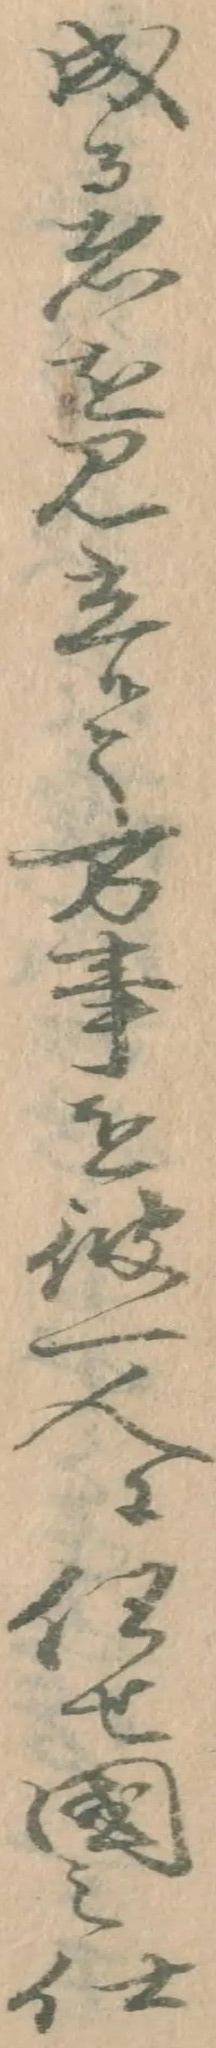成る者を見立候て万事を彼一人に任せ国之仕
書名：切支丹御退治記 49巻. [1]
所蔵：国立国会図書館 National Diet Library, JAPAN
